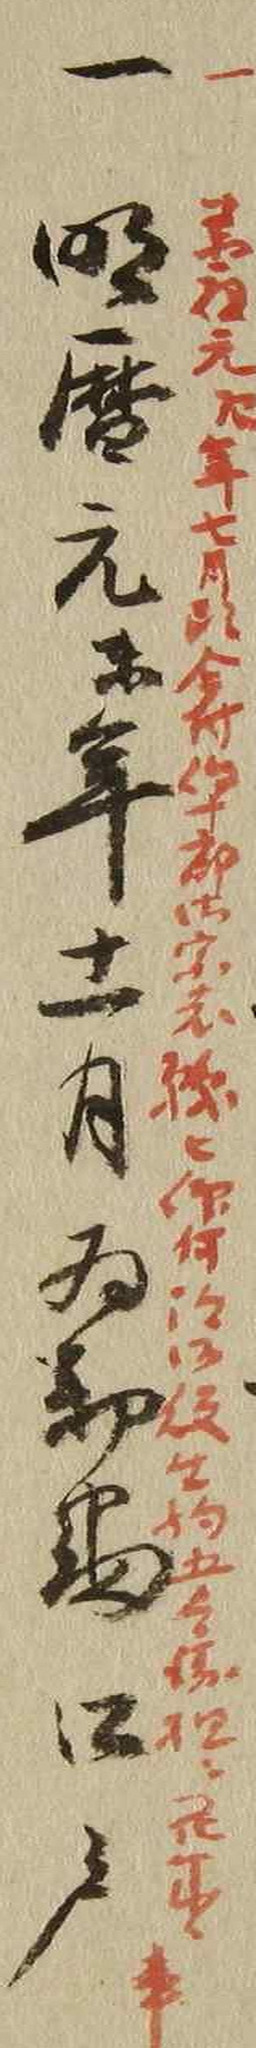一明暦元未年十一月為勤番江戸
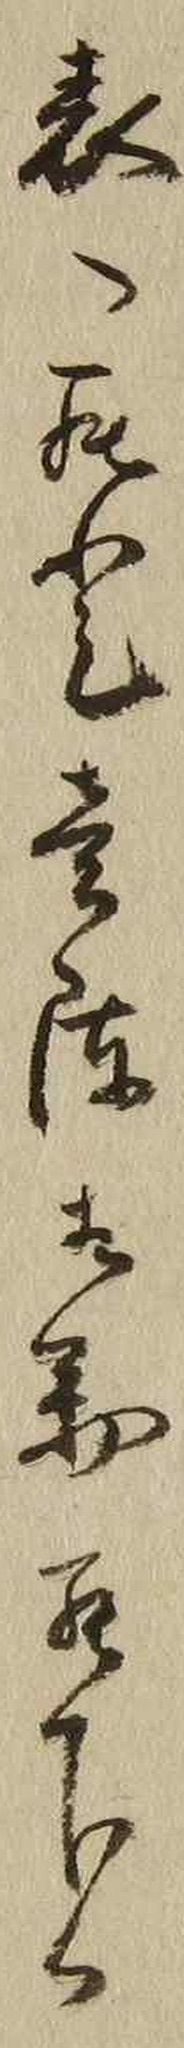表へ罷登壱陣相勤罷下候
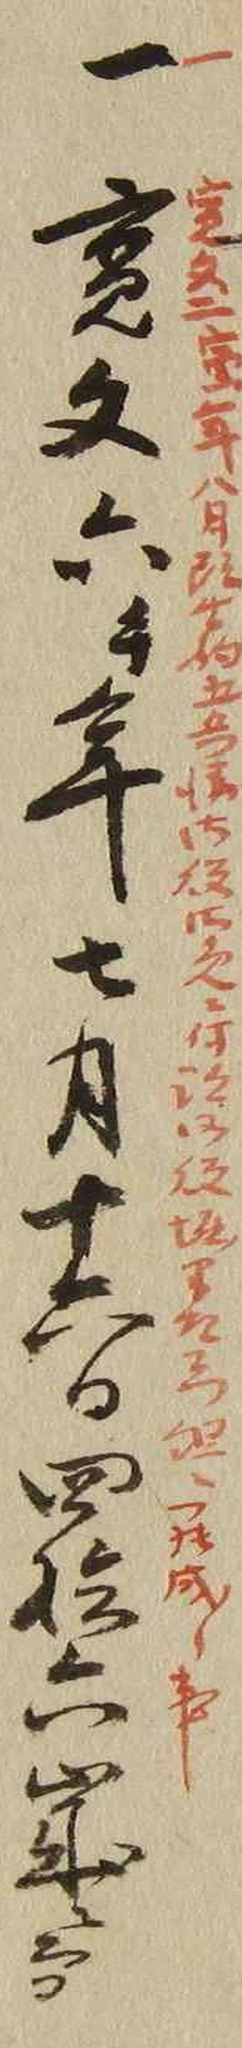一寛文六午年七月十六日四拾六歳ニ而
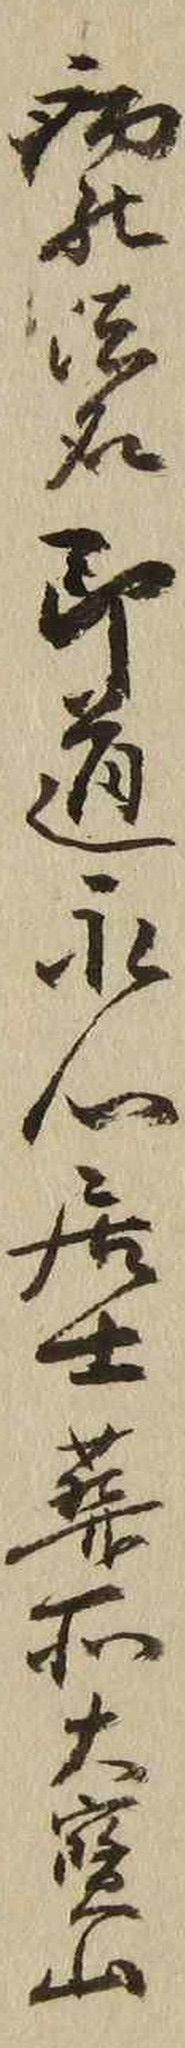病死法名即道永心居士葬所大宝山
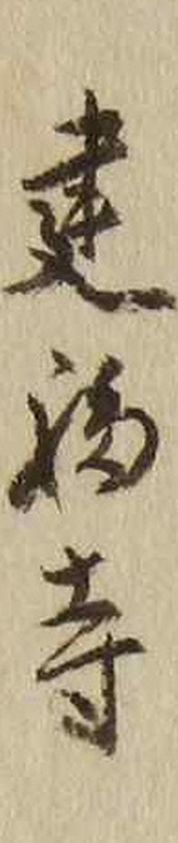建福寺

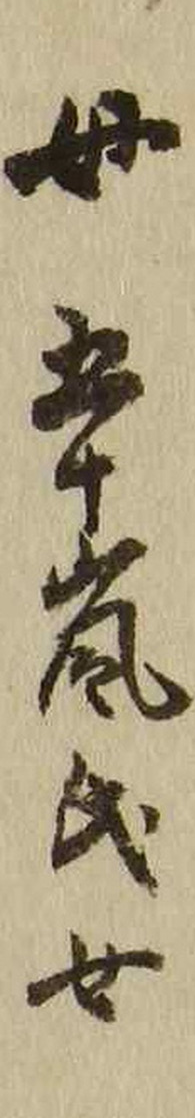母五十嵐氏女
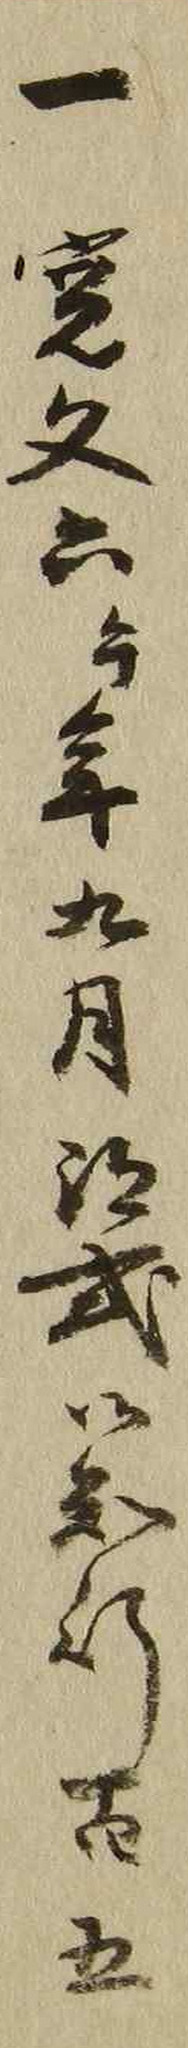一寛文六午年九月跡式御知行百五
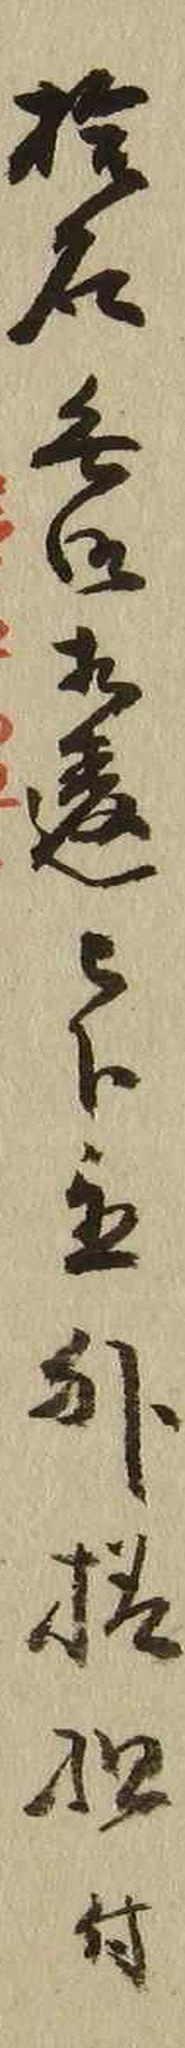拾石無御相違被下置外様組付
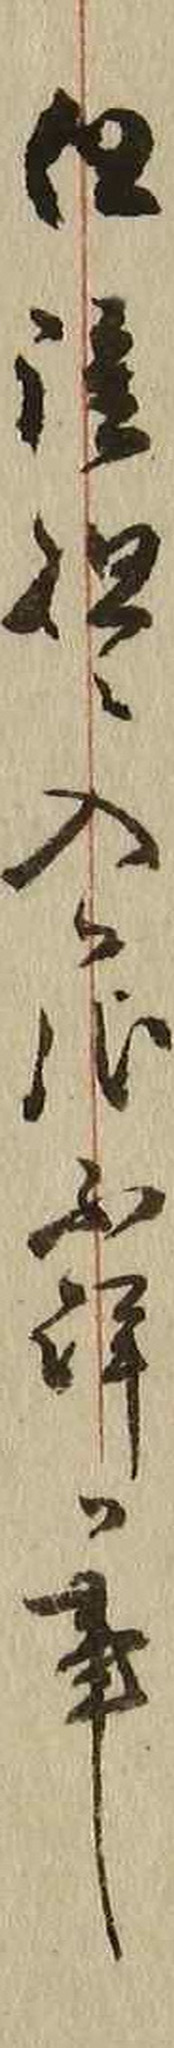但誰組ニ入候哉不詳候事
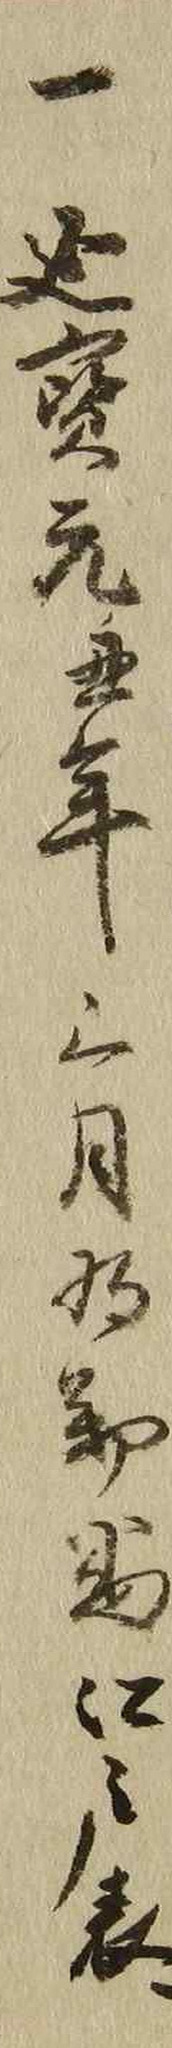一延宝元丑年三月為勤番江戸表へ
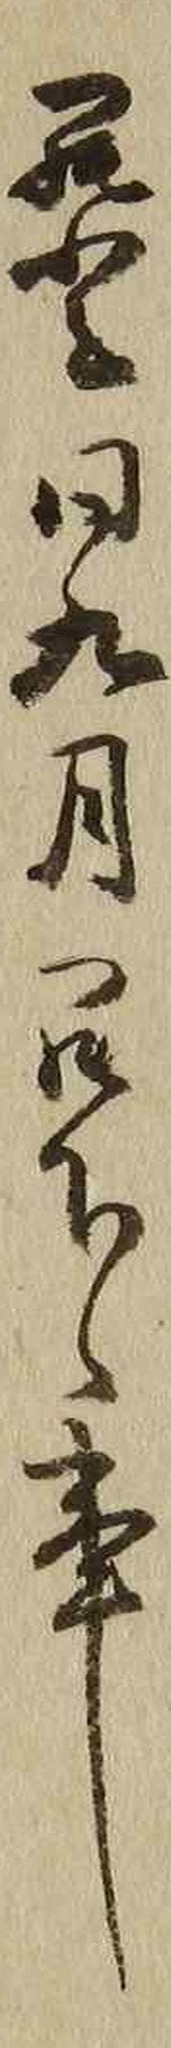罷登同九月罷下候事
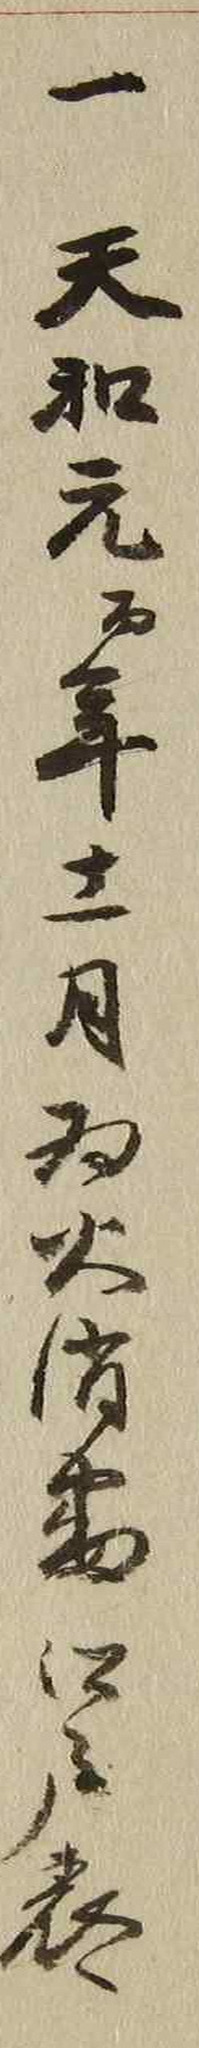一天和元酉年十一月為火消番江戸表へ
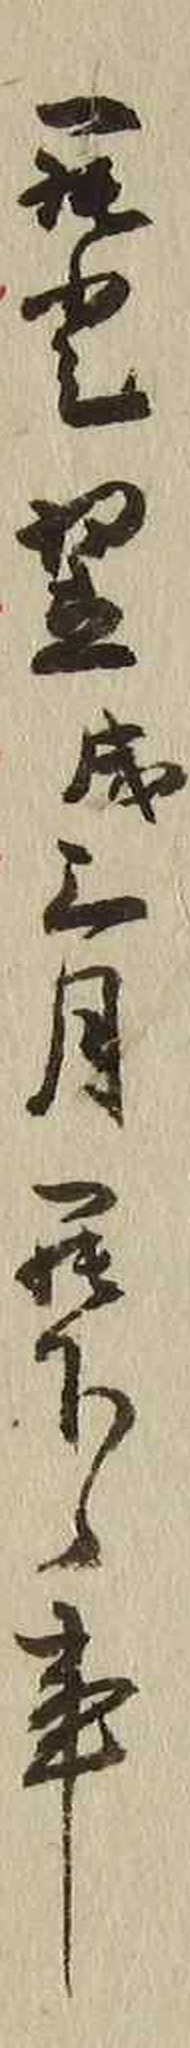罷登翌戌三月罷下候事
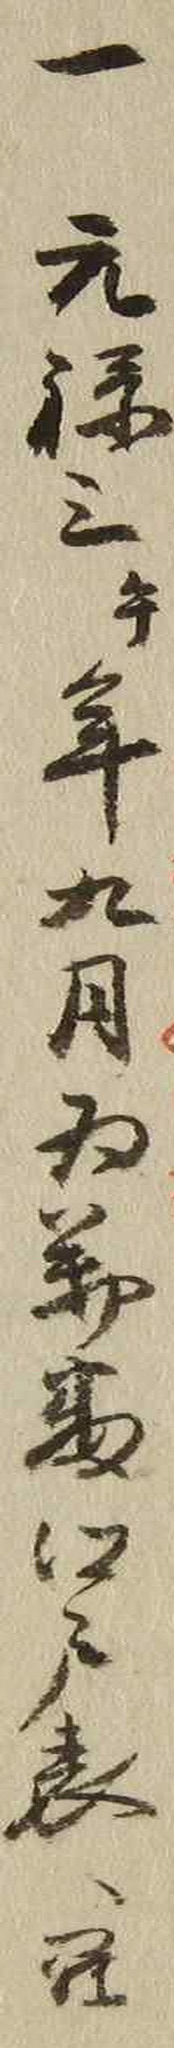一元禄三午年九月為勤番江戸表へ罷
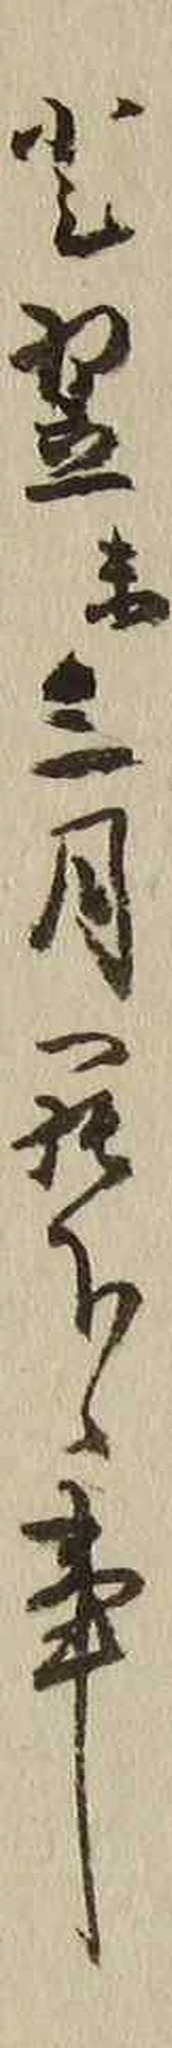登翌未三月罷下候事
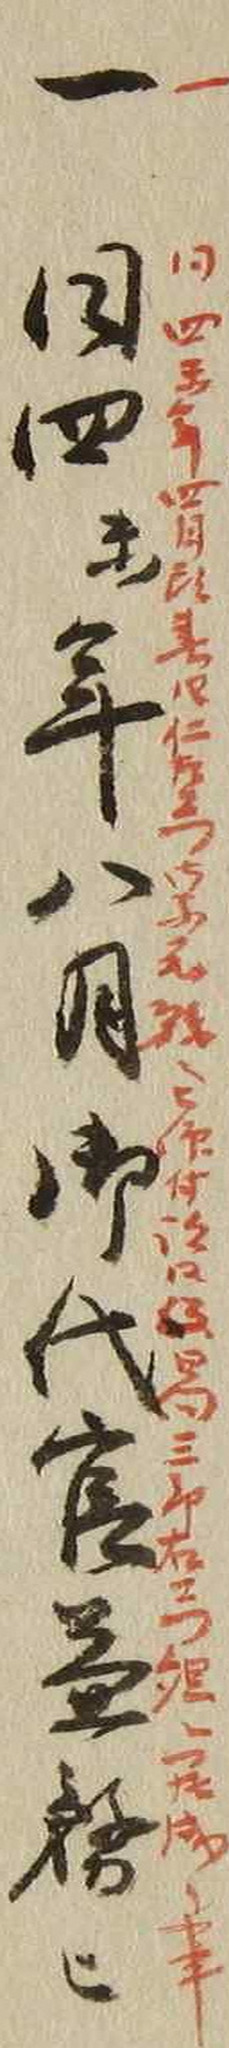一同四未年八月御代官兼務被
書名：諸士系譜　巻之232　け之部1
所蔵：会津若松市立会津図書館
